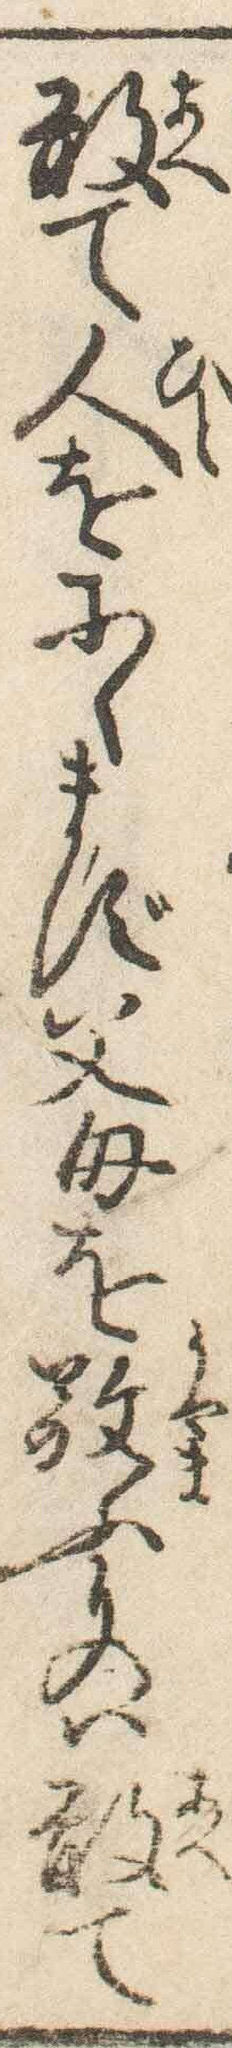敢て人をにくまず父母を敬ふものは敢えて
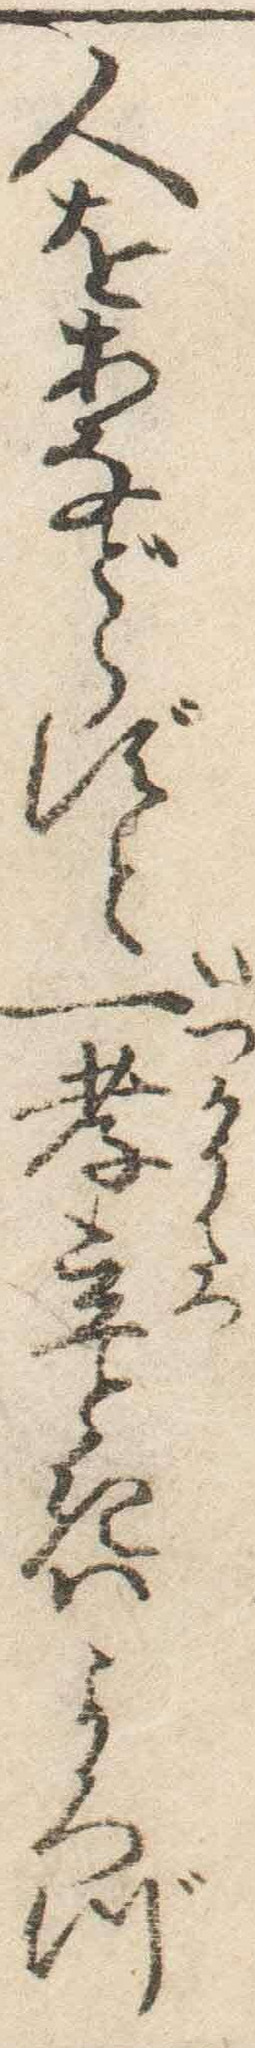人をあなどらずと一孝立ときはよろづ
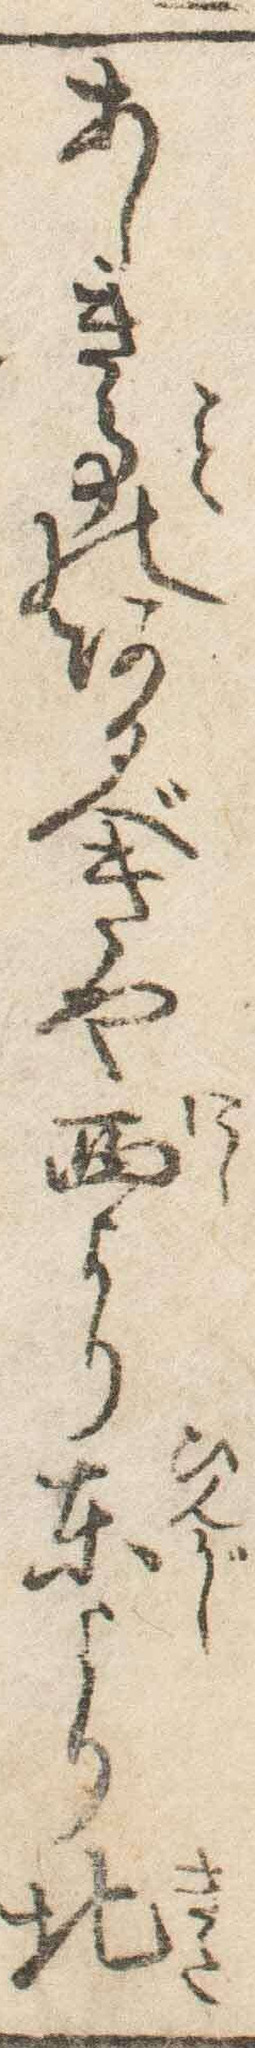あしき事のあるべきや西より東より北
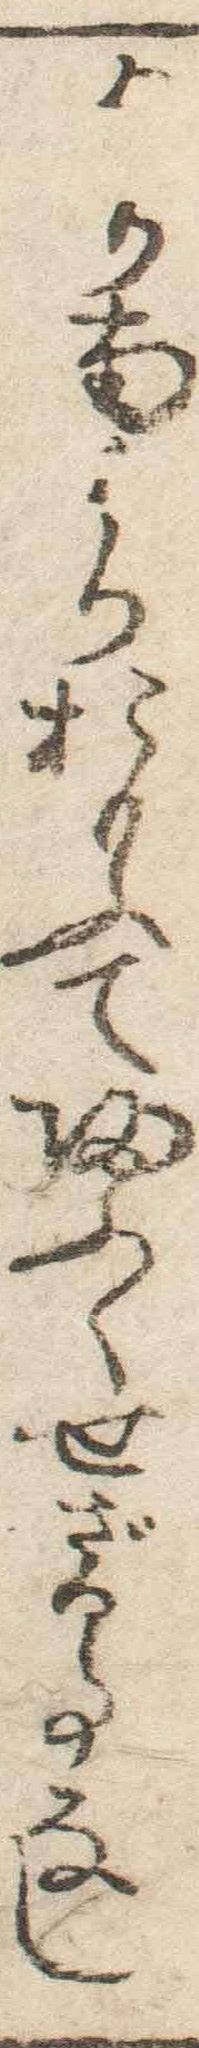より南よりおもふて帰ふくせざる事なし
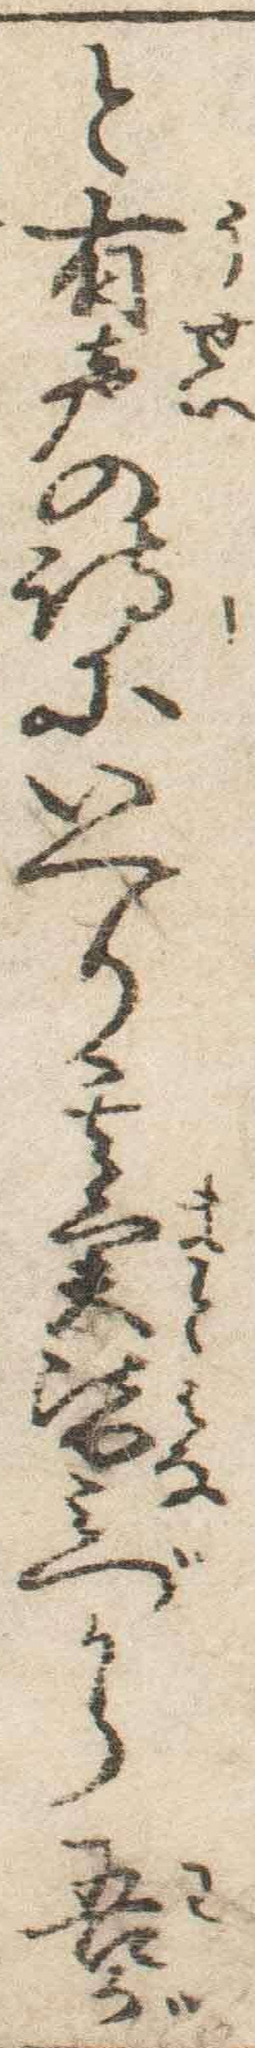と有声の伝にいへり其実皆みづから吾が
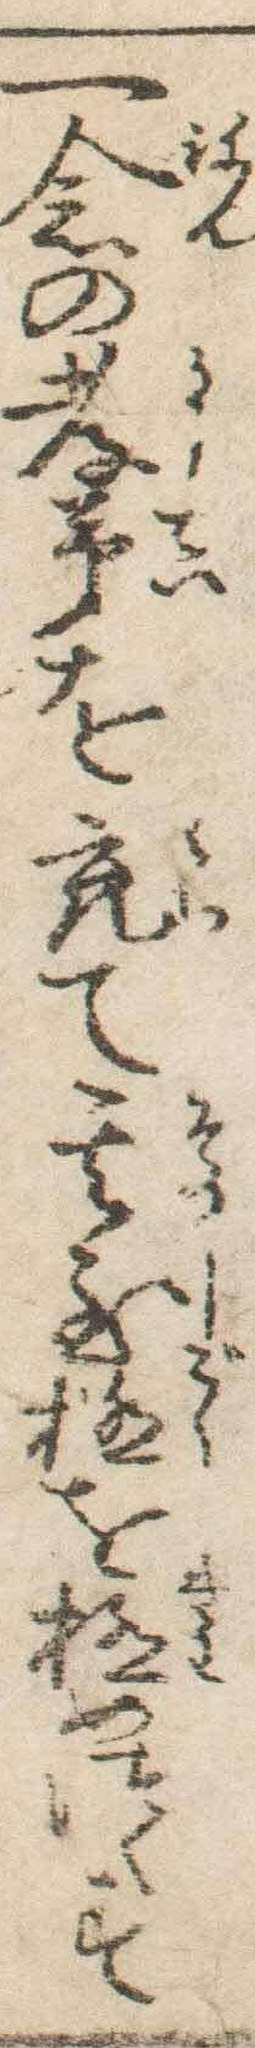一念の孝弟を充て其至極を極めつくす
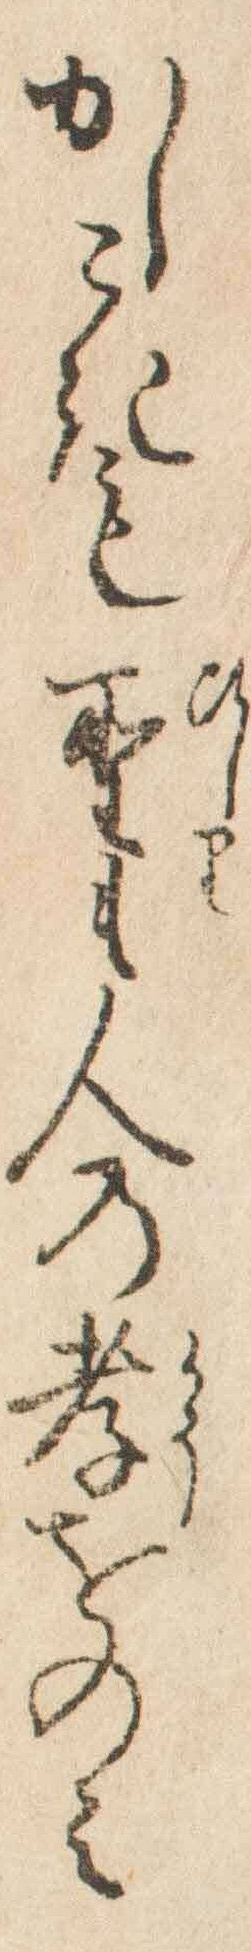かしこきも聖も人の孝をのみ
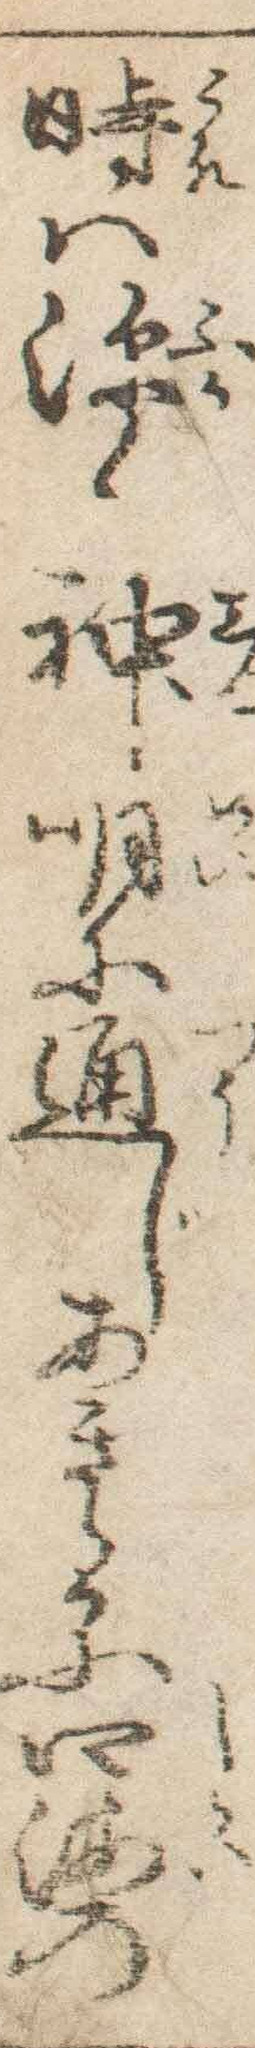時は深く神明に通じあきらかに四海の
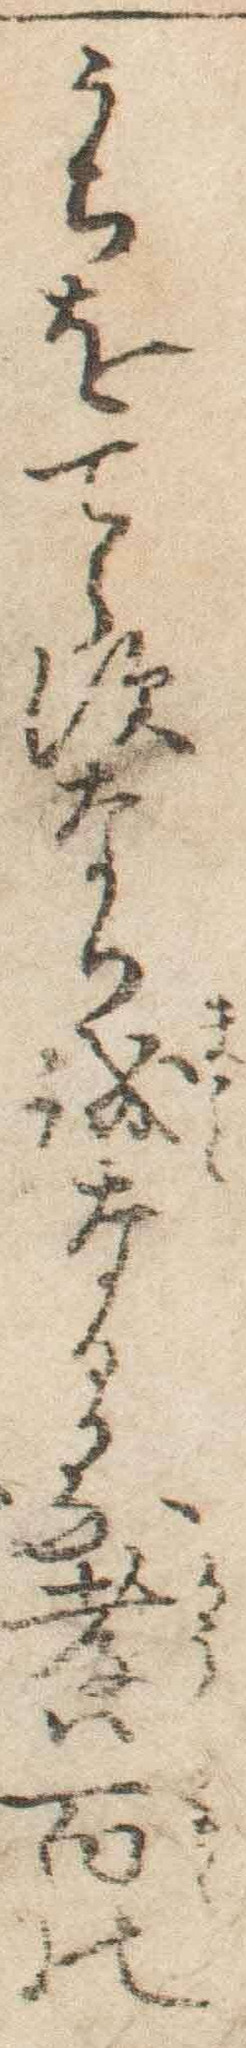うちをてらすなり誠なるかな孝は百の
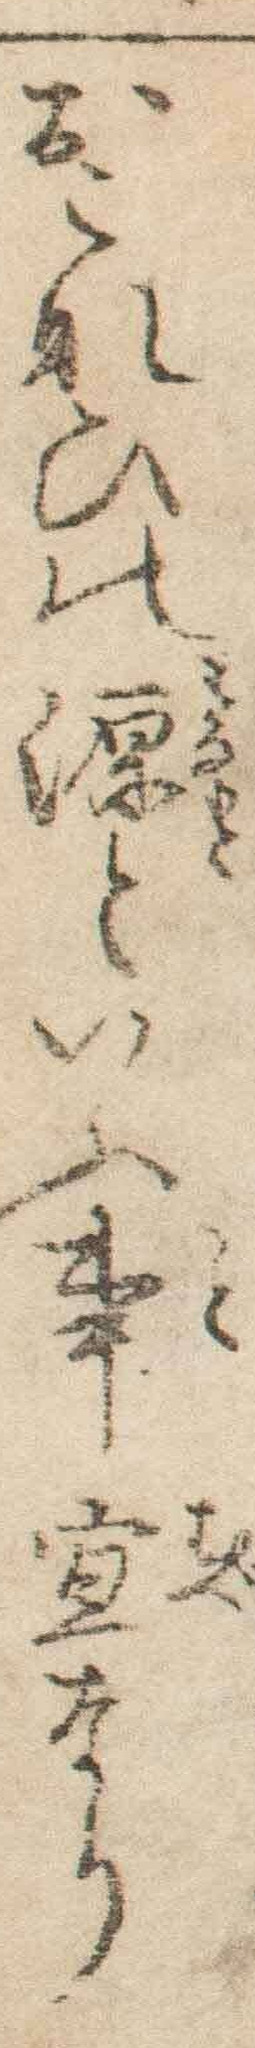おこなひの源といふ事宜なり

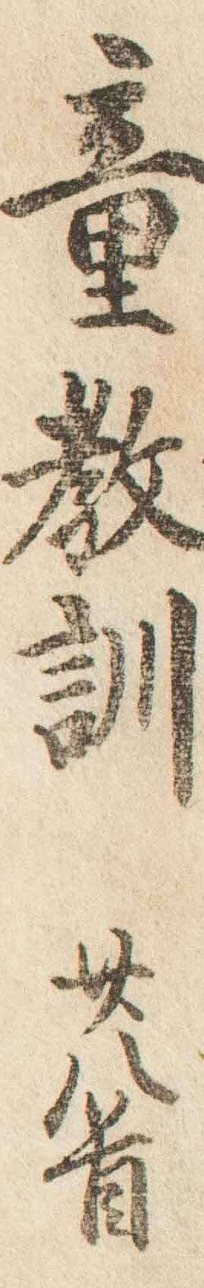童教訓廿八首
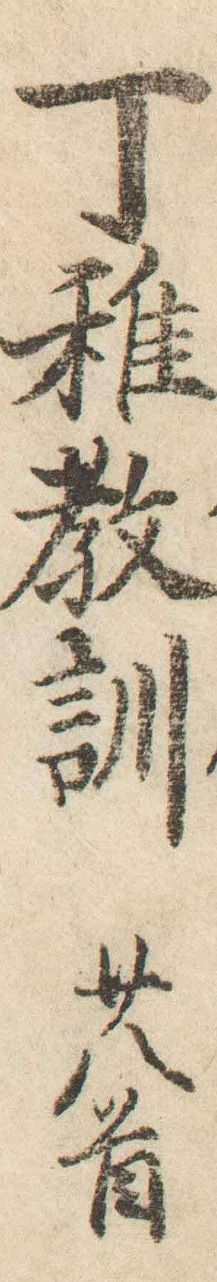丁稚教訓廿八首
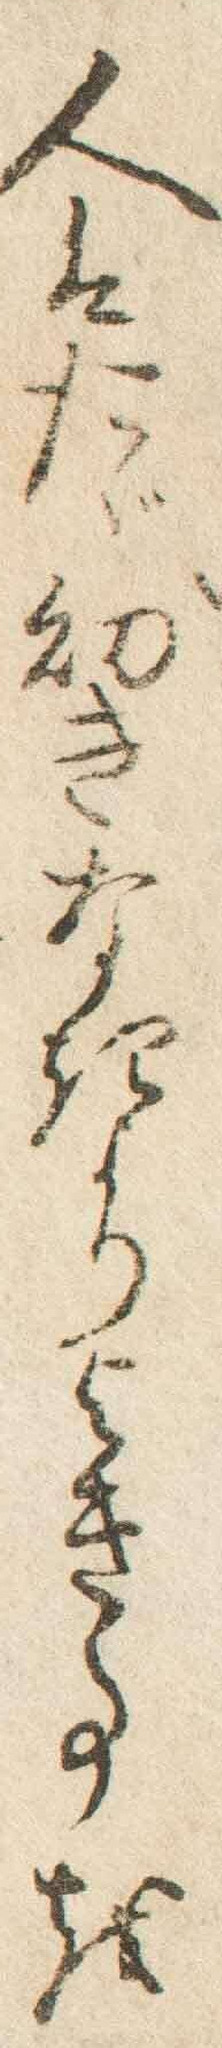人はたゞ幼きなきよりよき事を
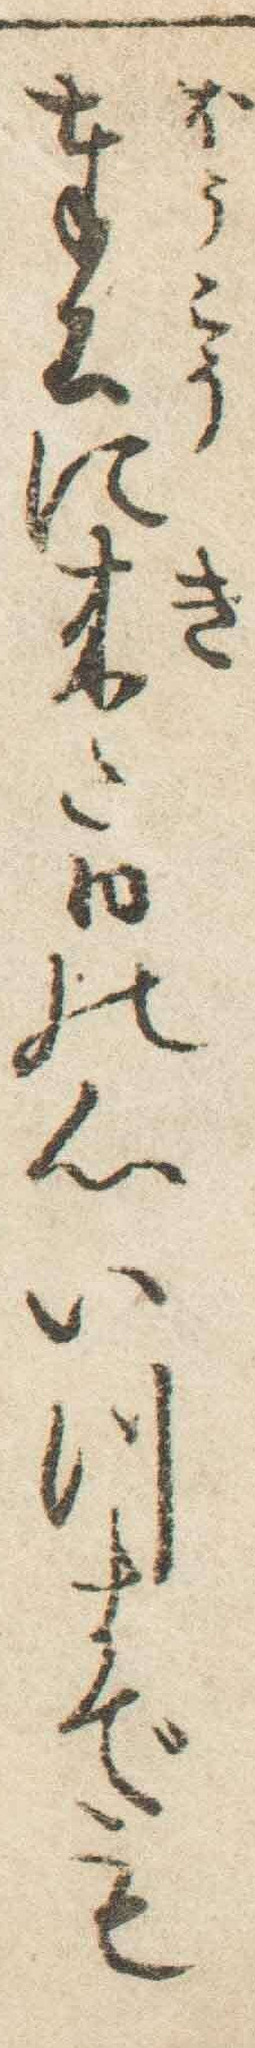奉公に来た日の心いつまでも
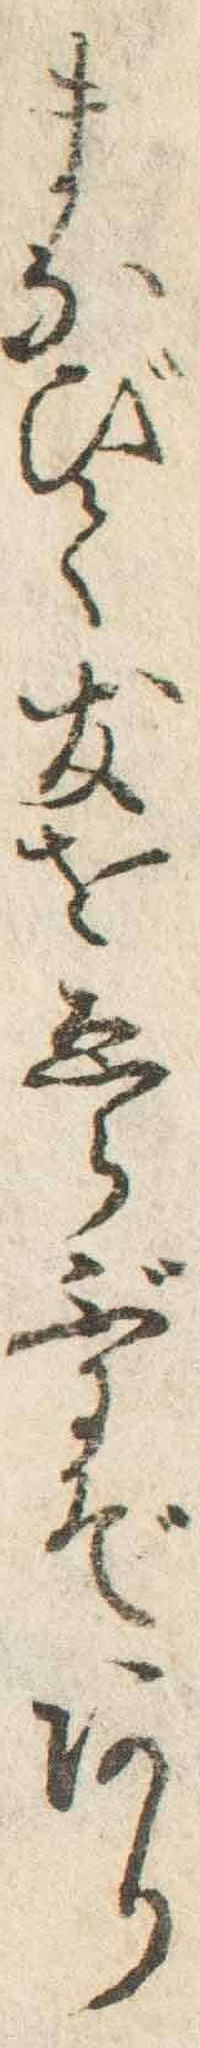まなびて友をゑらぶにぞあり
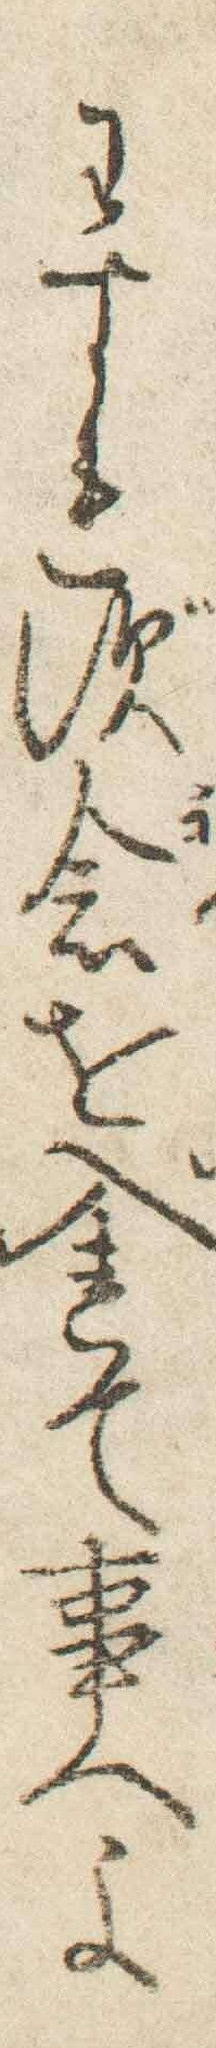わすれず念を入れて事へよ
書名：撫育草
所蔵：東京学芸大学附属図書館 国文学研究資料館
